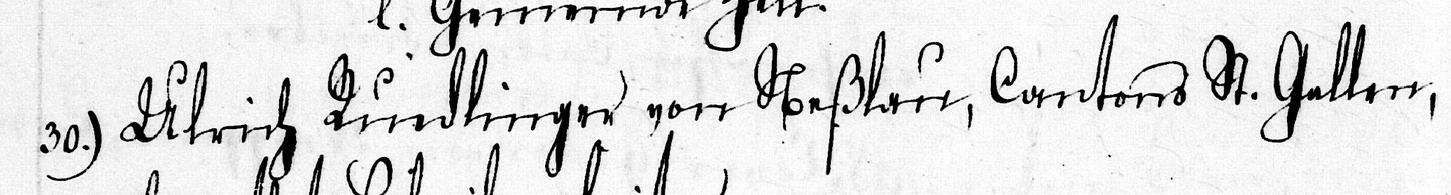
30.) Ulrich Ruedlinger von Neßlau, Cantons St. Gallen,
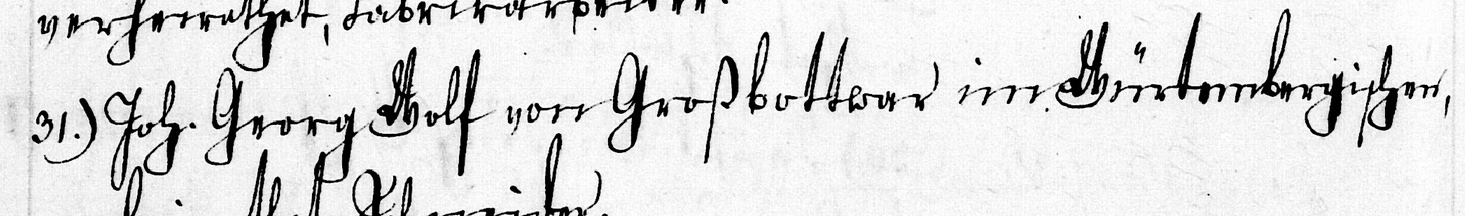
31.) Joh. Georg Wolf von Großbottwar im Würtembergischen,
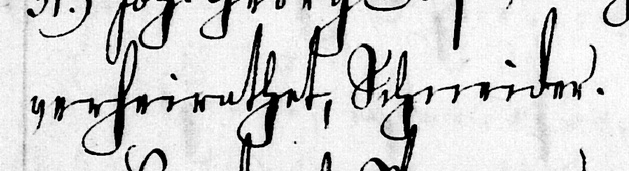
verheirathet, Schneider.
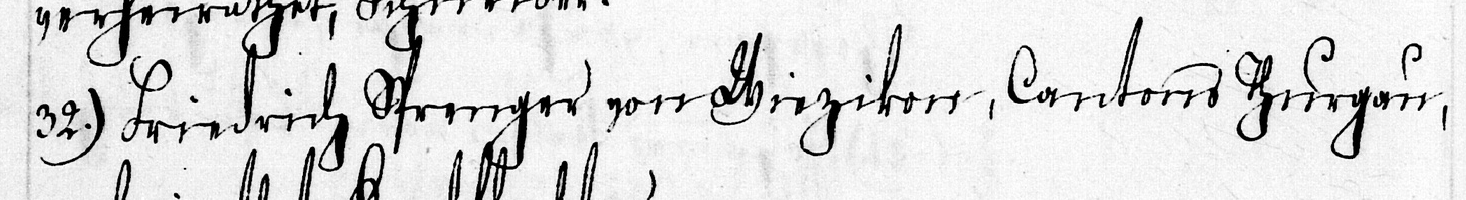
32.) Friedrich Sprenger von Wiezikon, Cantons Thurgau,
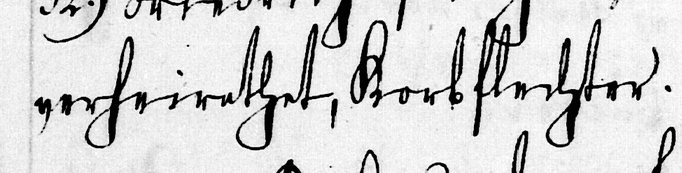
verheirathet, Korbflechter.
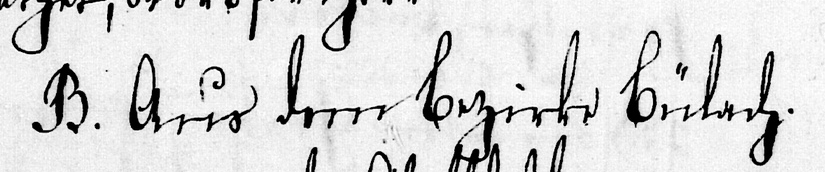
B. Aus dem Bezirk Bülach.
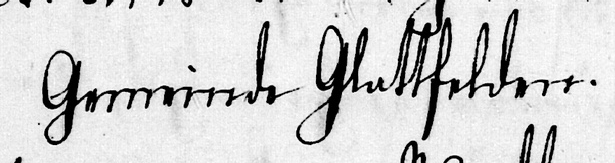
Gemeinde Glattfelden.
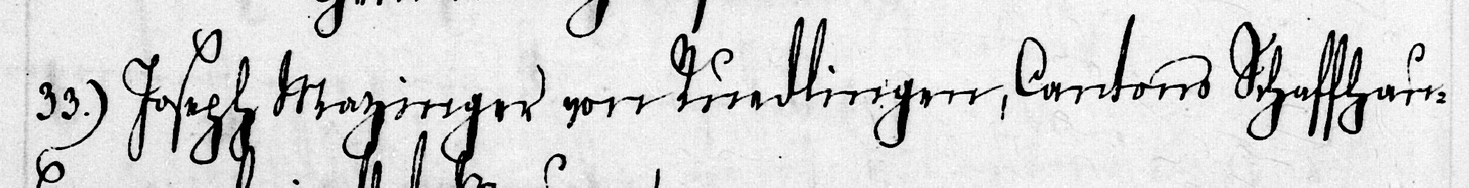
33.) Joseph Mazinger von Ruedlingen, Cantons Schaffhau¬
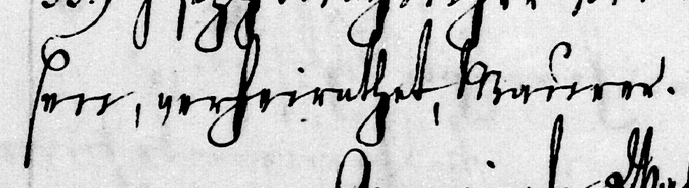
sen, verheirathet, Maurer.
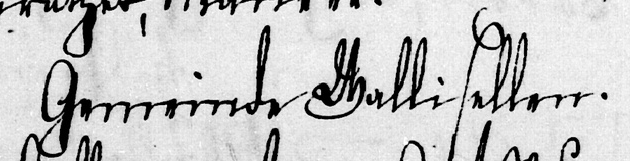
Gemeinde Wallisellen.
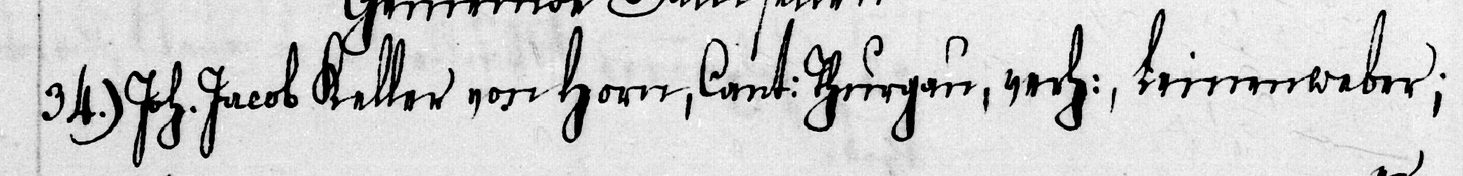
34.) Joh. Jacob Keller von Horn, Cant: Thurgau, verh:, Leinenweber;
